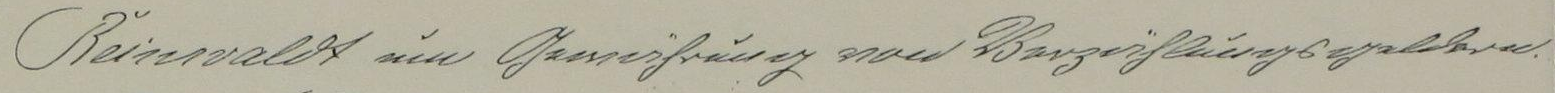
Reinwaldt um Gewährung von Verzählungsgeldern
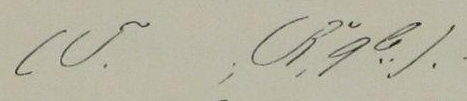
(T. ; R.9b).
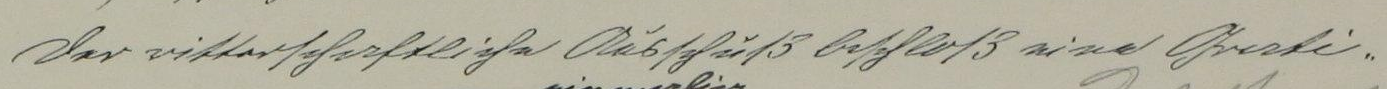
Der ritterschaftliche Ausschuß beschloß eine Grati-
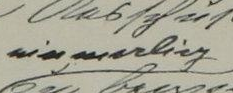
einmalig
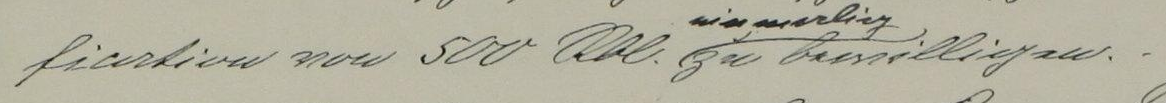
fication von 500 Rbl. zu bewilligen.
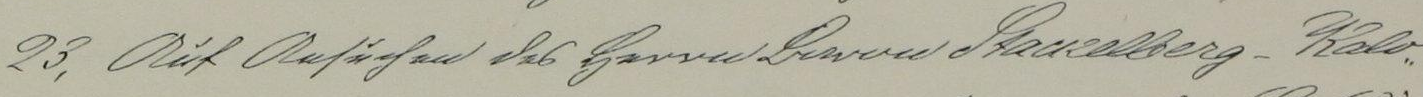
23. Auf Ansuchen des Herrn Baron Stackelberg-Kalo-
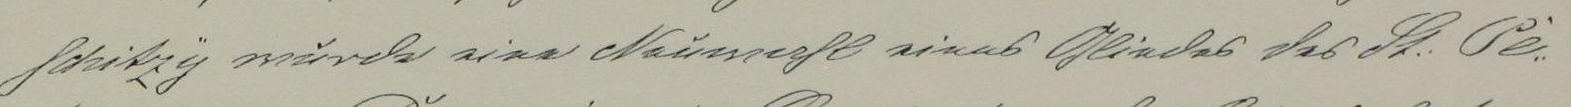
schitzy wurde eine Neuwahl eines Gliedes des St. Pe-
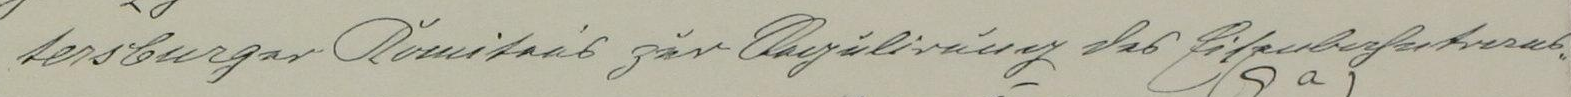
tersburger Komitees zur Regulierung des Eisenbahntrans-
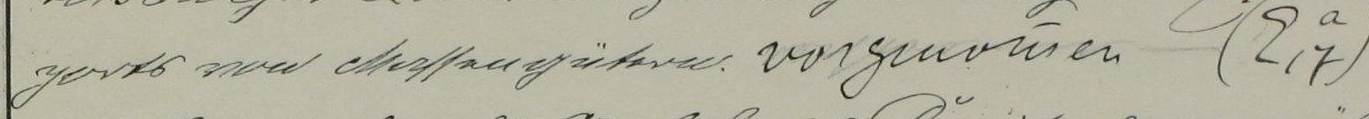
ports von Massengütern vorgenommen (E.17a).
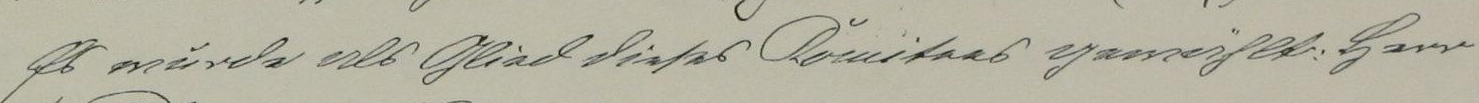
Es wurde als Glied dieses Komitees gewählt: Herr
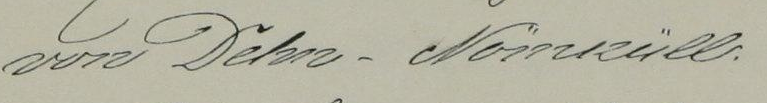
von Dehn-Nömküll.
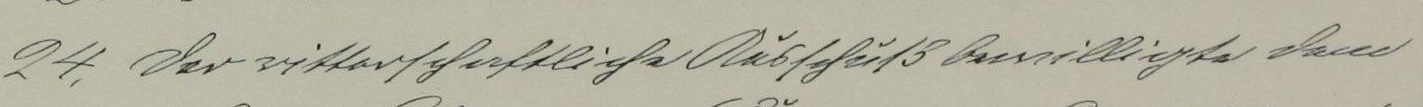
24. Der ritterschaftliche Ausschuß bewilligte dem
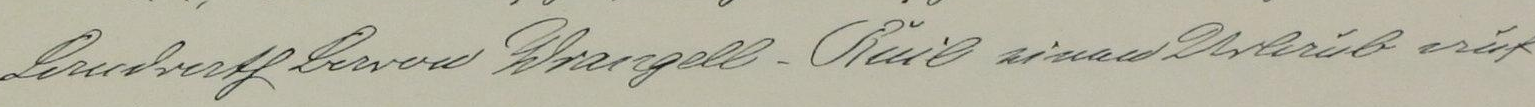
Landrath Baron Wrangell-Ruil einen Urlaub auf
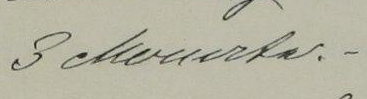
3 Monate.
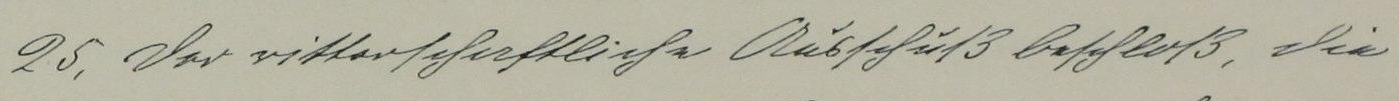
25. Der ritterschaftliche Ausschuß beschloß, die
